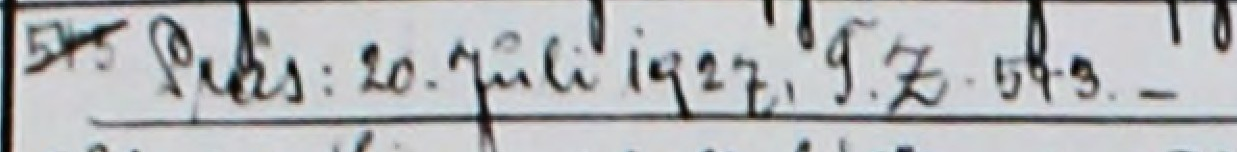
543 Präs: 20. Juli 1927, T.Z. 543.-
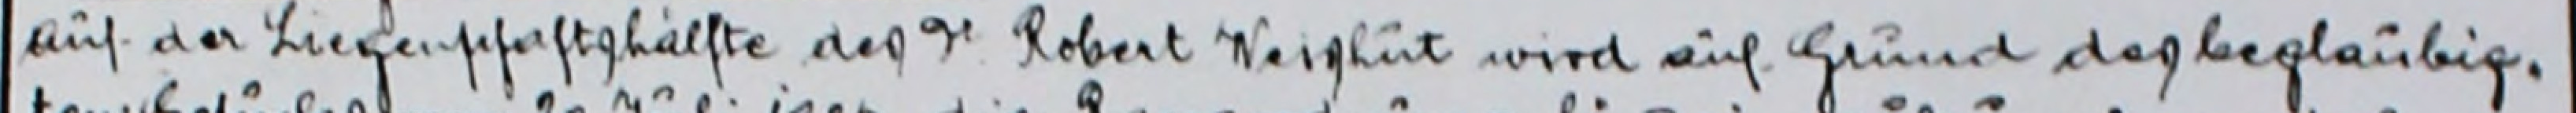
Auf der Liegenschaftshälfte des Dr. Robert Weishut wird auf Grund des beglaubig„
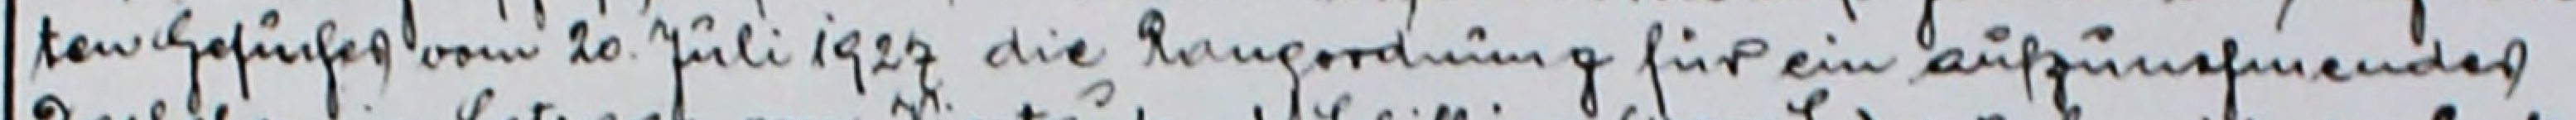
ten Gesuches vom 20. Juli 1927 die Rangordnung für ein aufzunehmendes
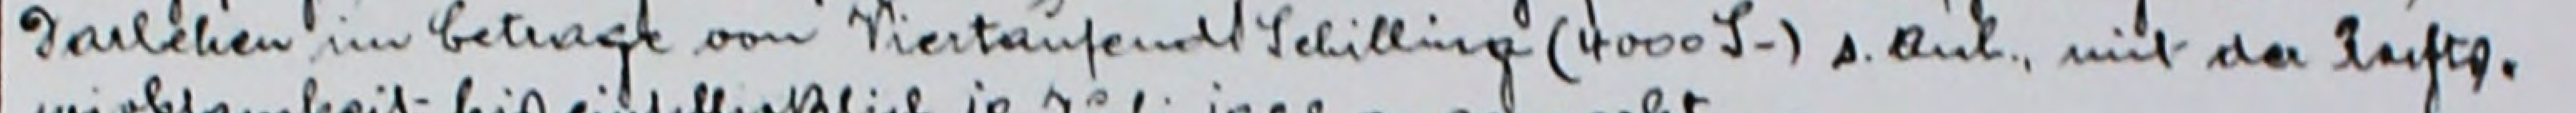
Darlehen im betrage von Viertausend Schilling (4000 S-) samt, mit der Rechts„
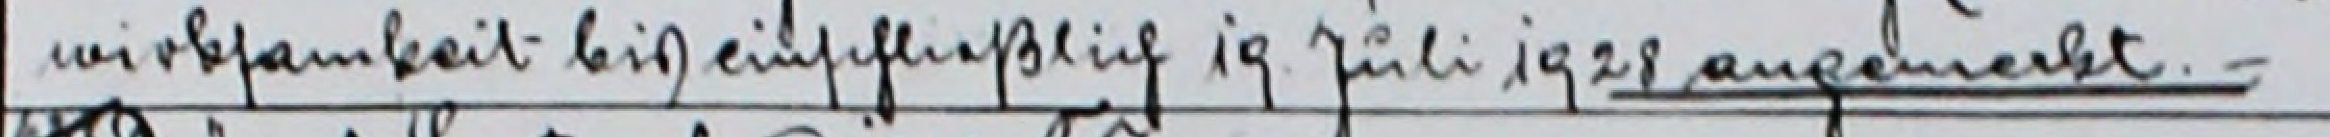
wirksamkeit bis einschließlich 19. Juli 1928 angemerkt.-
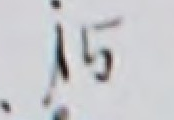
15
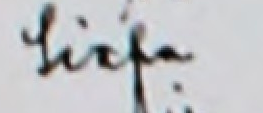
Liehe
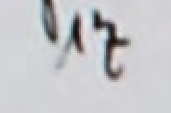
17
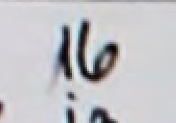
16
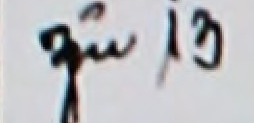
zu 13
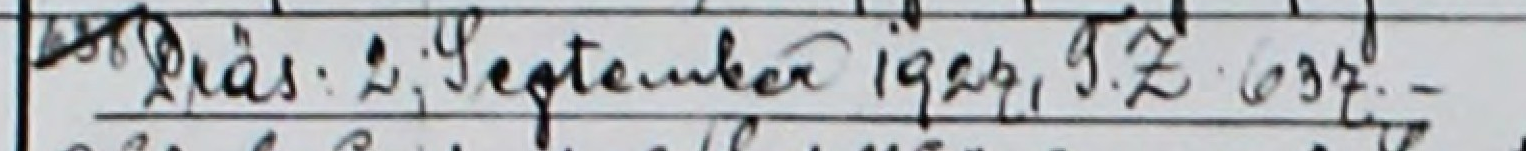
638 Präs: 2, September 1927, T.Z. 637.-
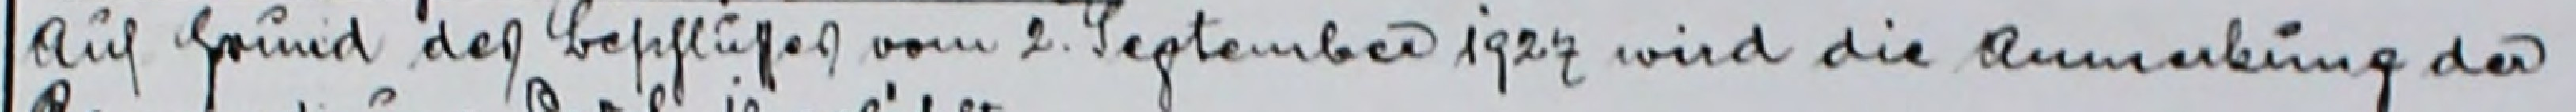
Auf Grund des Beschlusses vom 2. September 1927 wird die Anmerkung der
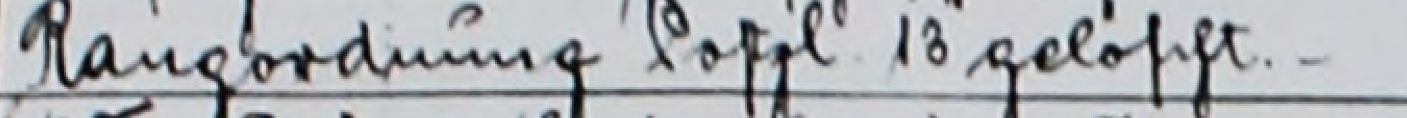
Rangordnung Postzl 13 gelöscht.-
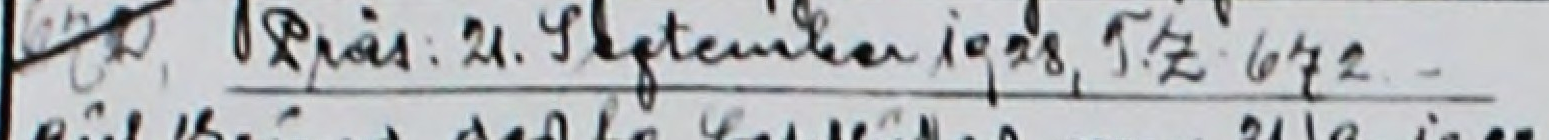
672, Präs: 21. September 1928, T.Z. 672.-
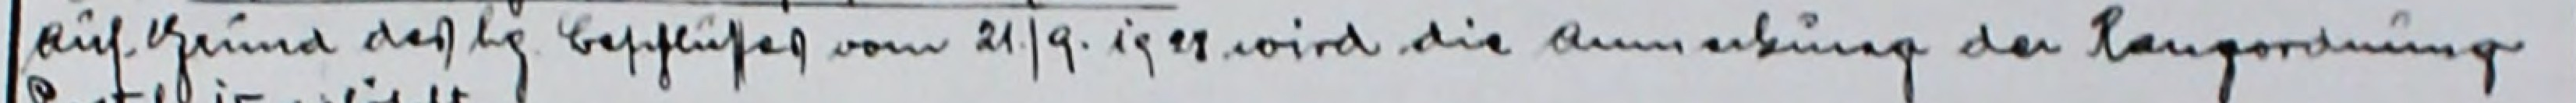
Auf Grund des hg. Beschlusses vom 21.9. 1928 wird die Anmerkung der Rangordnung
